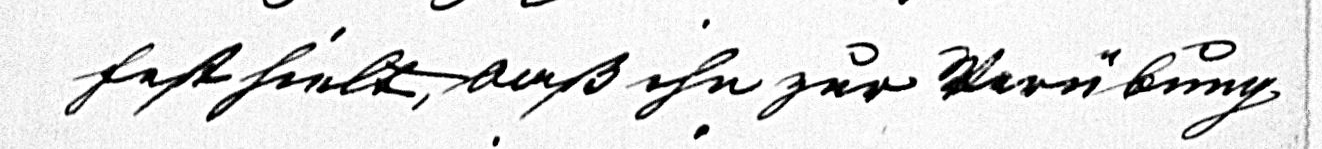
fest hielt, daß ihn zur Verübung
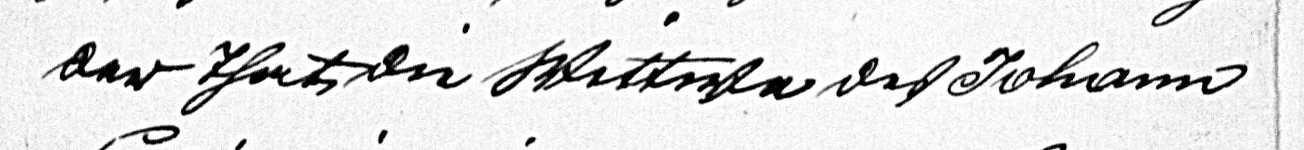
der That die Wittwer des Johann
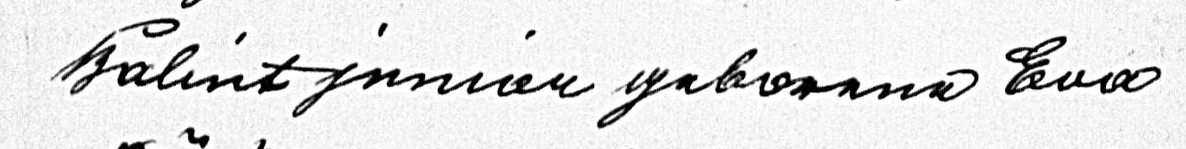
Balint junior geborene Eva
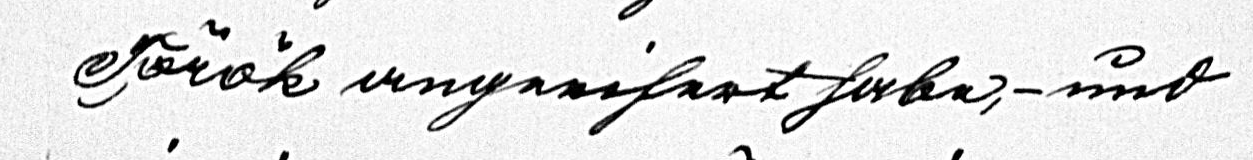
Török angeeifert habe,-und
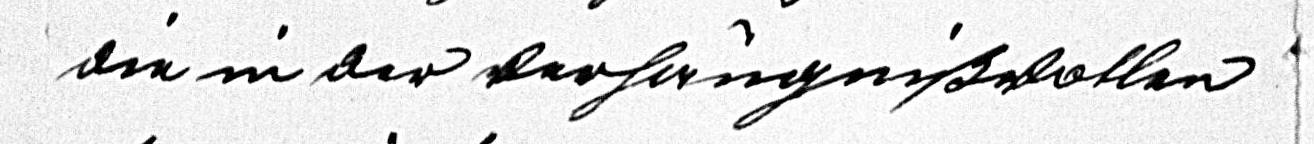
die in der verhängnißvollen
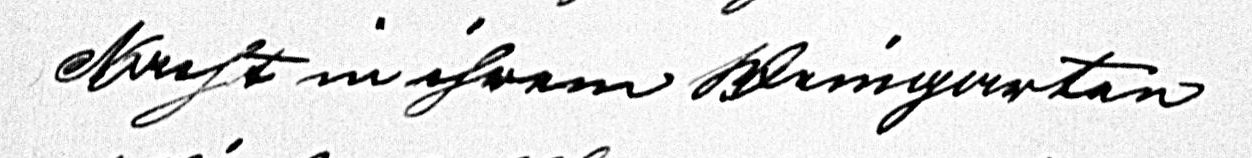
Nacht in ihrem Weingarten
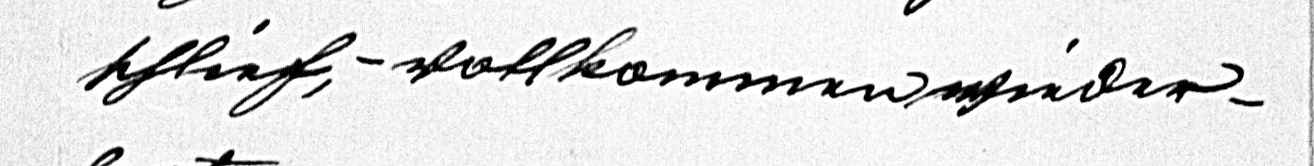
schlief, -vollkommen wieder¬
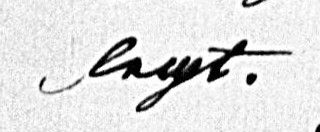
legt.
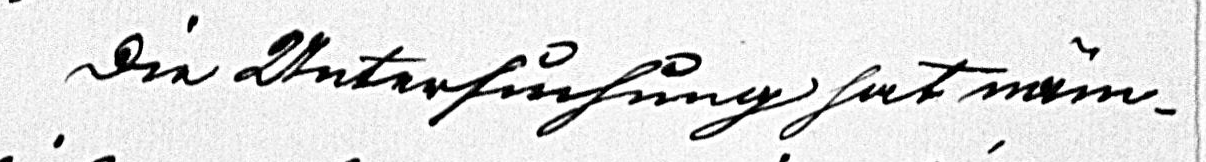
Die Untersuchung hat näm¬
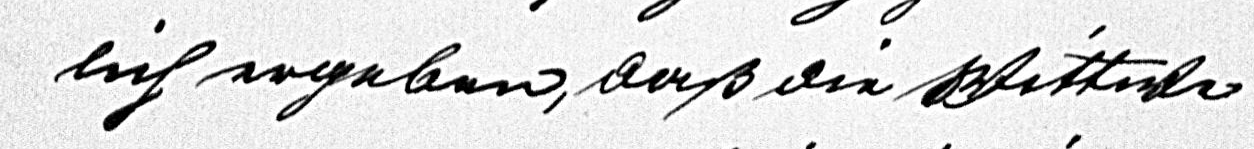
lich ergeben, daß die Wittwe
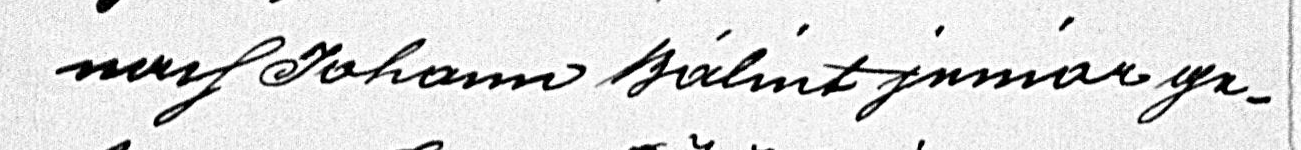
nach Johann Bálint junior ge¬
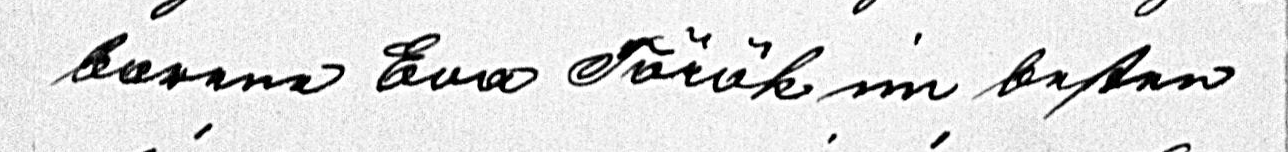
borene Eva Török im besten
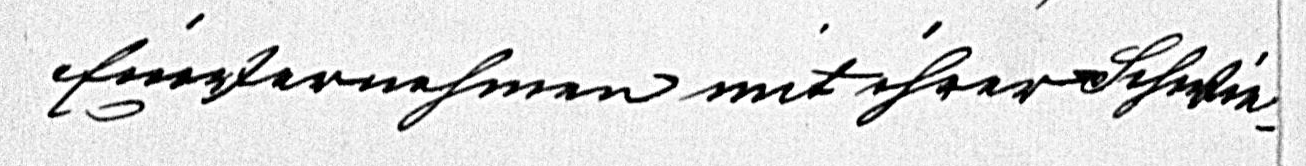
Einvernahmen mit ihrer Schwie¬
